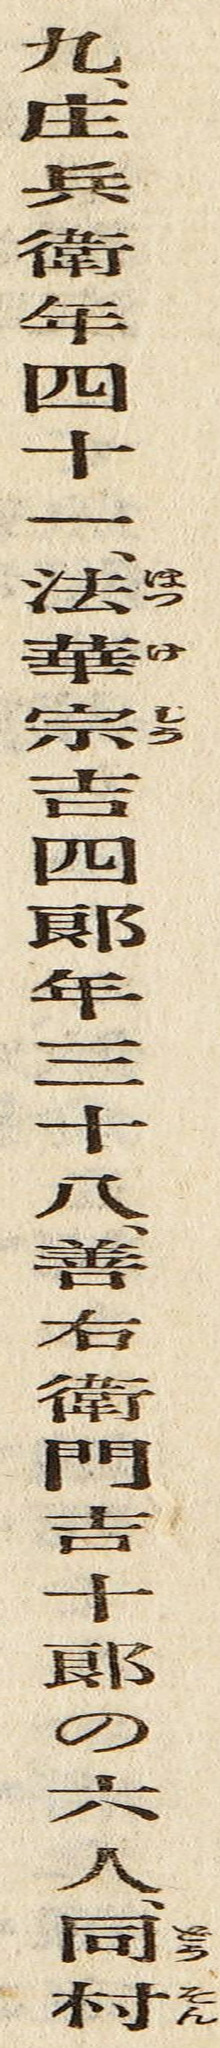九、庄兵衛年四十一、法華宗吉四郎年三十八、善右衛門吉十郎の六人、同村
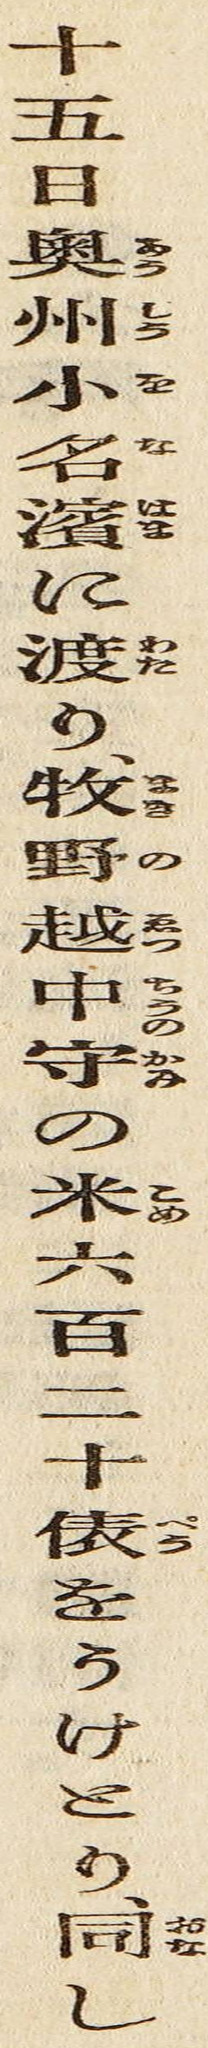十五日奥州小名浜に渡り、牧野越中守の米六百二十俵をうけとり、同し
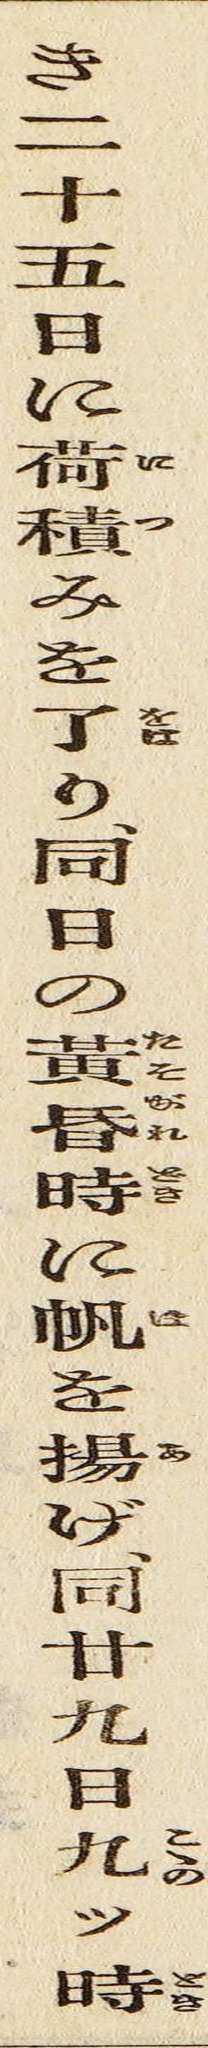き二十五日に荷積みを了り、同日の黄昏時に帆を揚げ、同廿九日九ツ時
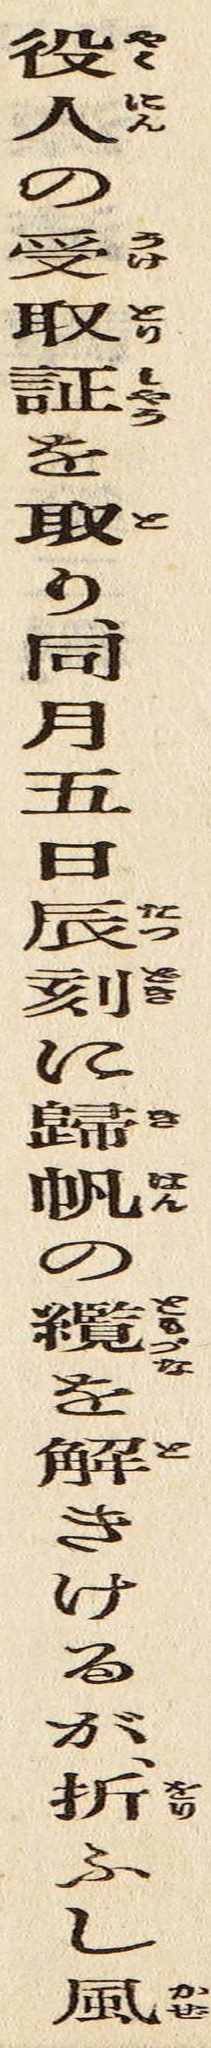役人の受取証を取り、同月五日辰刻に帰帆の纜を解きけるが、折ふし風
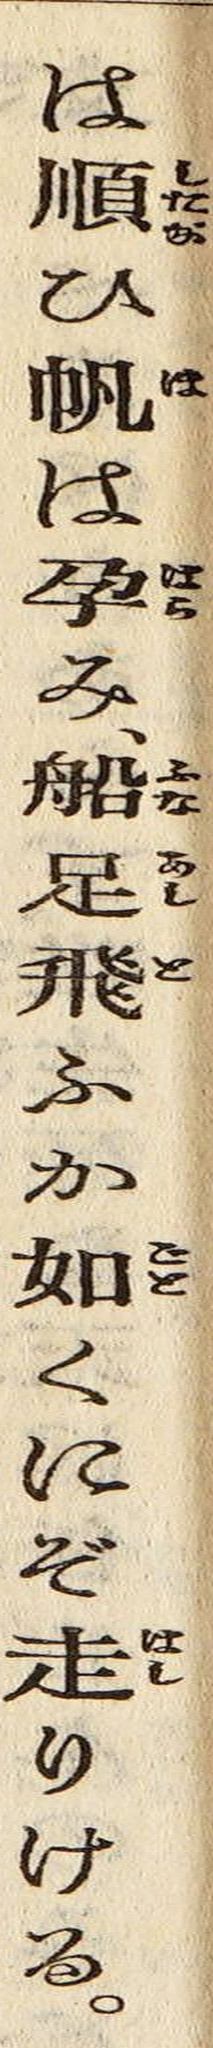は順ひ帆は孕み、船足飛ふか如くにぞ走りける。
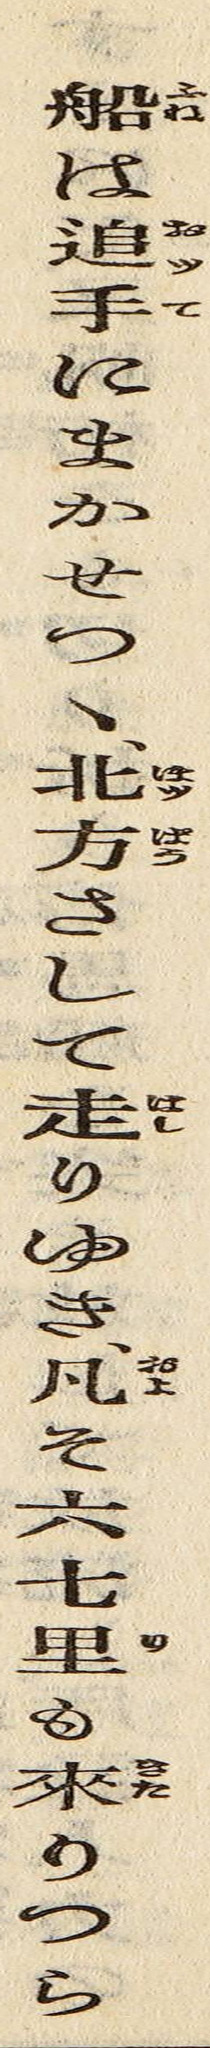船は追手にまかせつヽ、北方さして走りゆき、凡そ六七里も来りつら
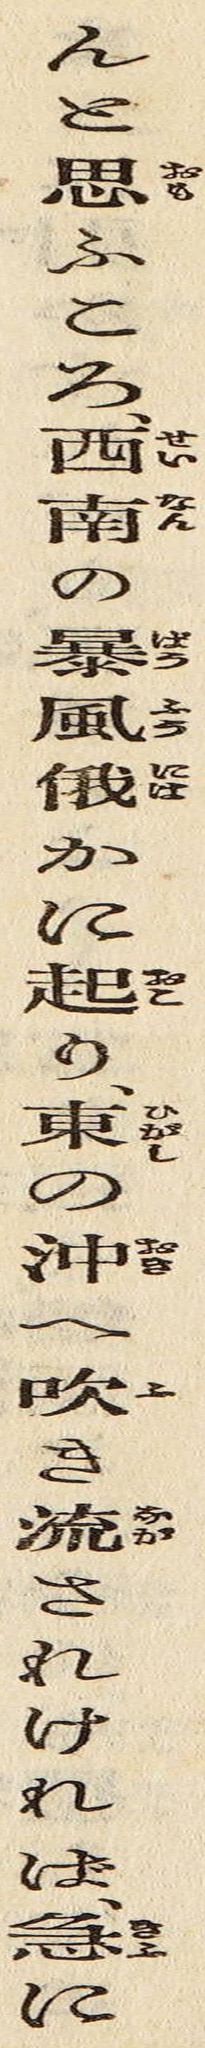んと思ふころ、西南の暴風俄かに起り、東の沖へ吹き流されければ、急に
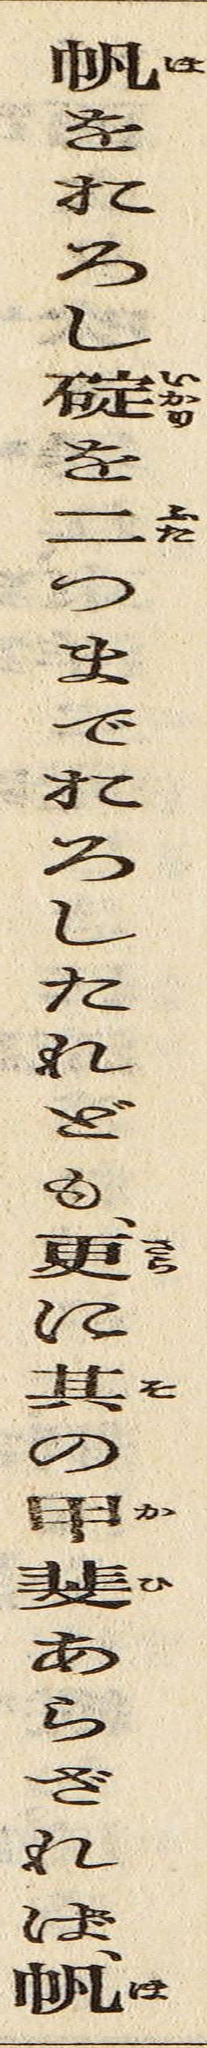帆をおろし碇を二つまでおろしたれども、更に其の甲斐あらざれば、帆
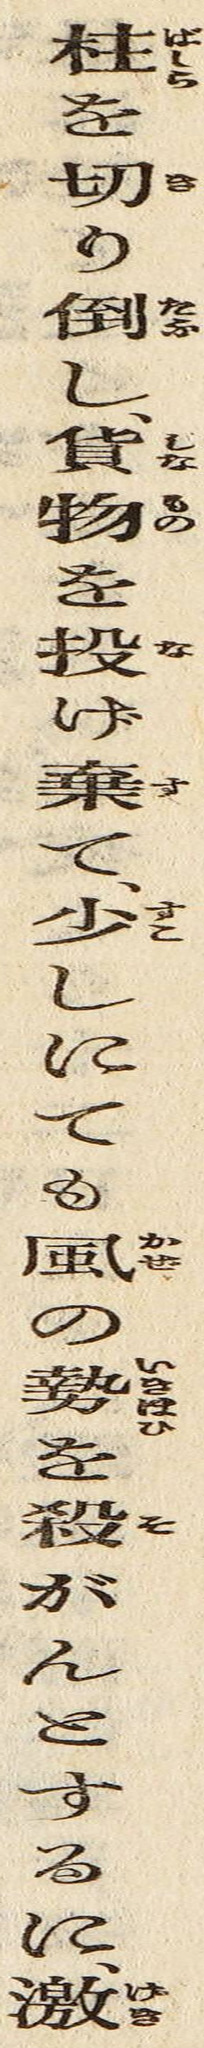柱を切り倒し、貨物を投げ棄て、少しにても風の勢を殺がんとするに、激
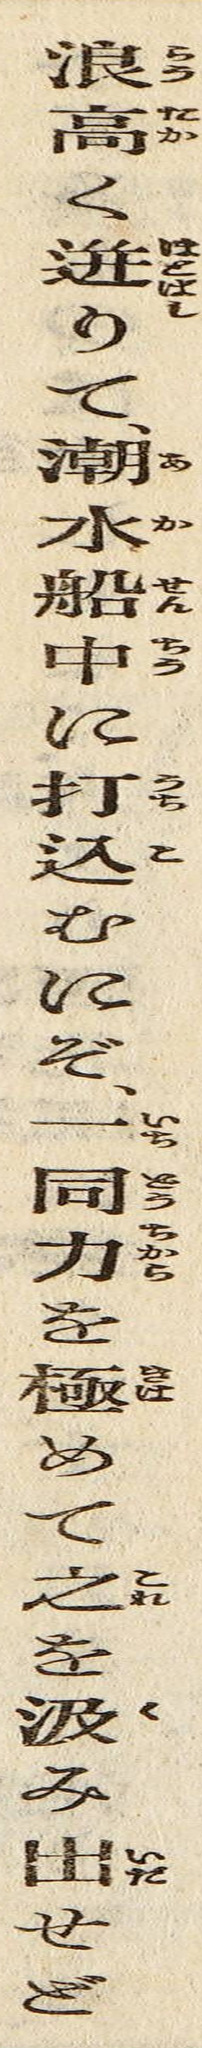浪高く迸りて、潮水船中に打込むにぞ、一同力を極めて之を汲み出せど
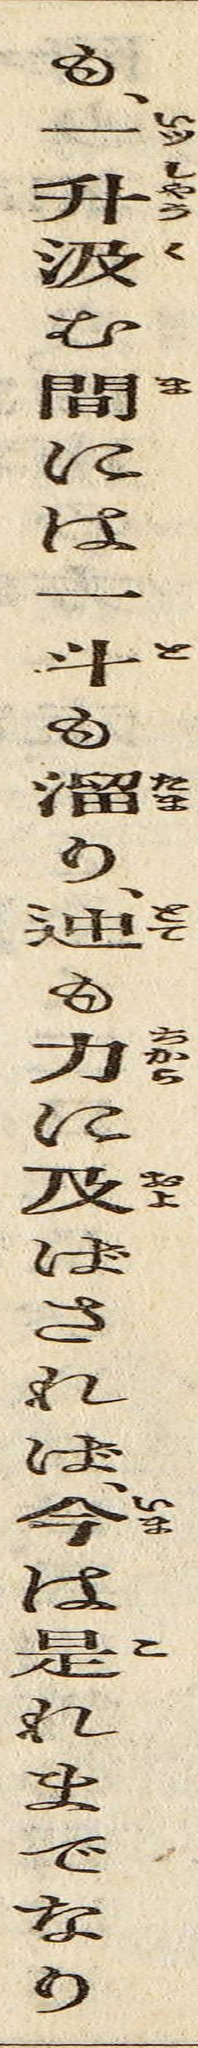も、一升汲む間には一斗も溜り、迚も力に及ばされば、今は是れまでなり
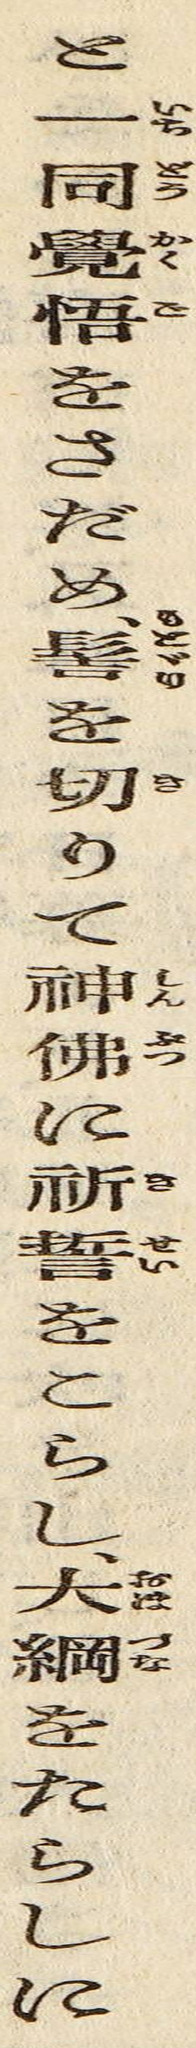と一同覚悟をさだめ、髻を切りて神仏に祈誓をこらし、大綱をたらしに
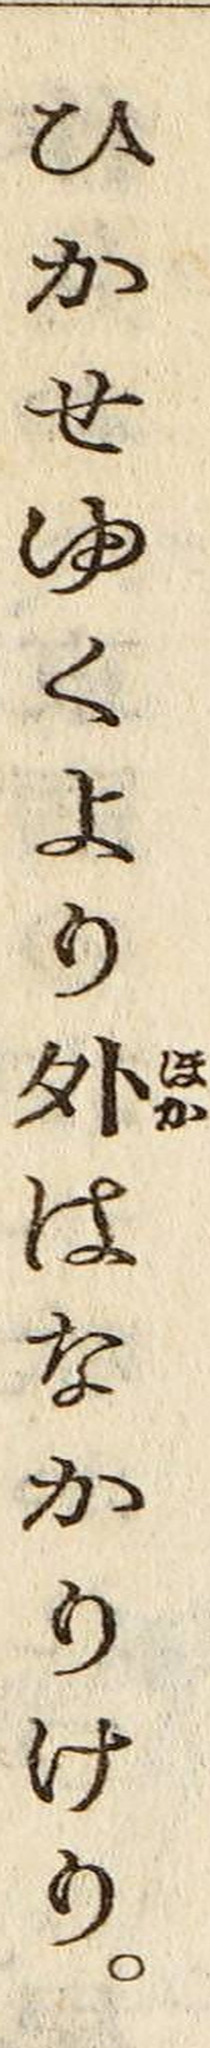ひかせゆくより外はなかりけり。
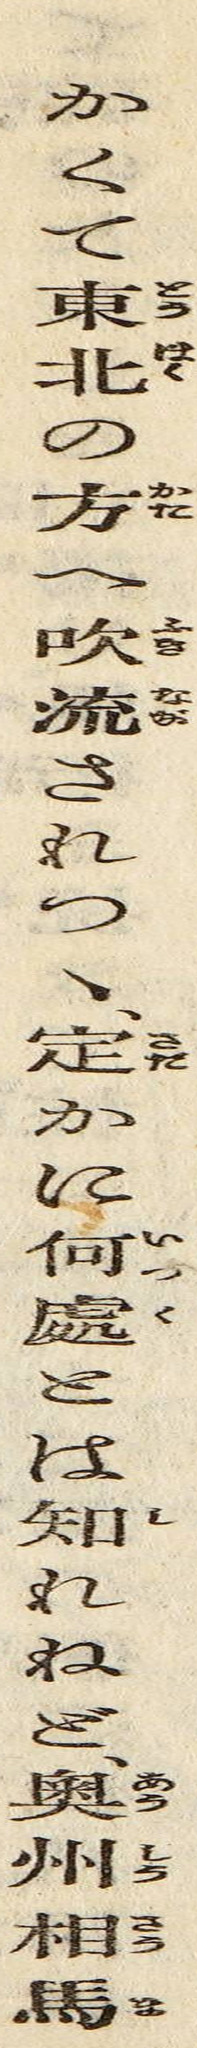かくて東北の方へ吹流されつヽ、定かに何処とは知れねど、奥州相馬
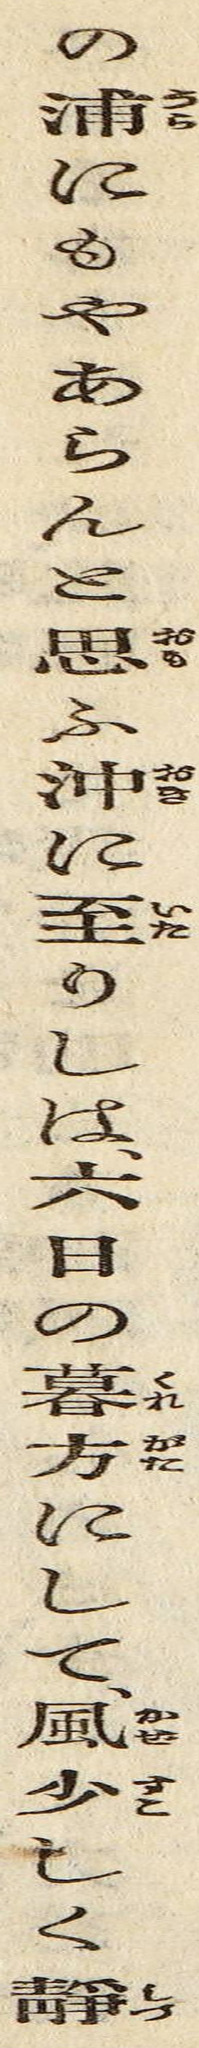の浦にもやあらんと思ふ沖に至りしは、六日の暮方にして、風少しく静
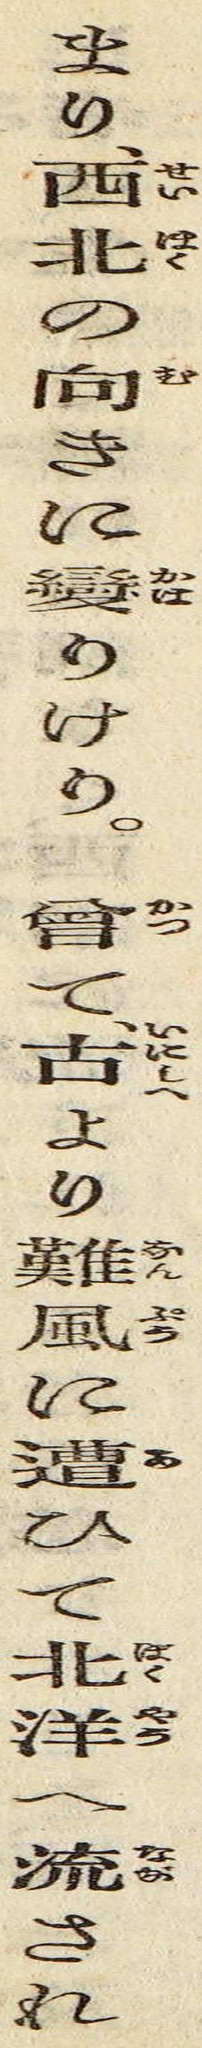まり、西北の向きに変りけり。曽て、古より難風に遭ひて北洋へ流され
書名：日本漂流譚
